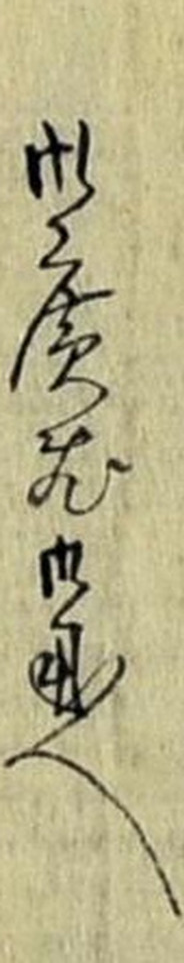御広敷御用人
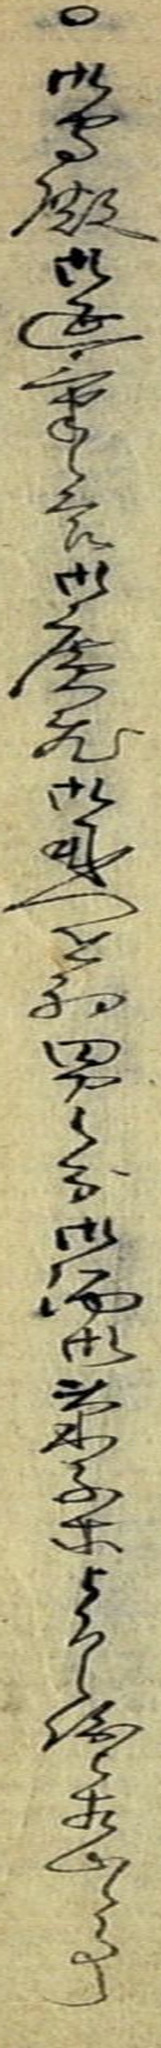○御守殿御延気之節御広敷御用人を初男之分御酒御菓子等被下候儀被相止候事
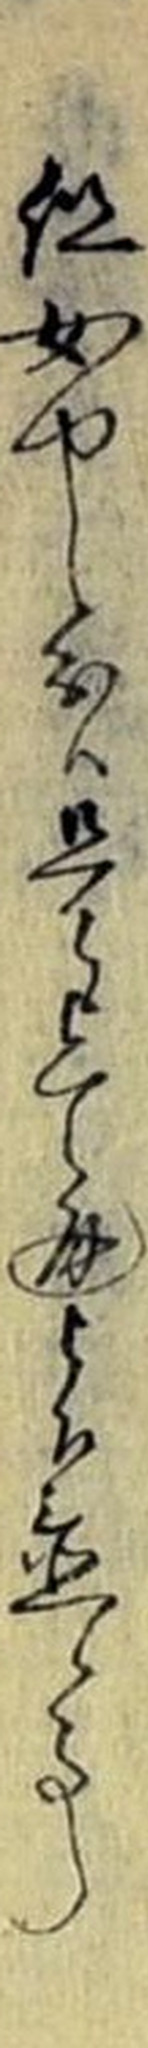但女中之分は是迄之通被下置候事
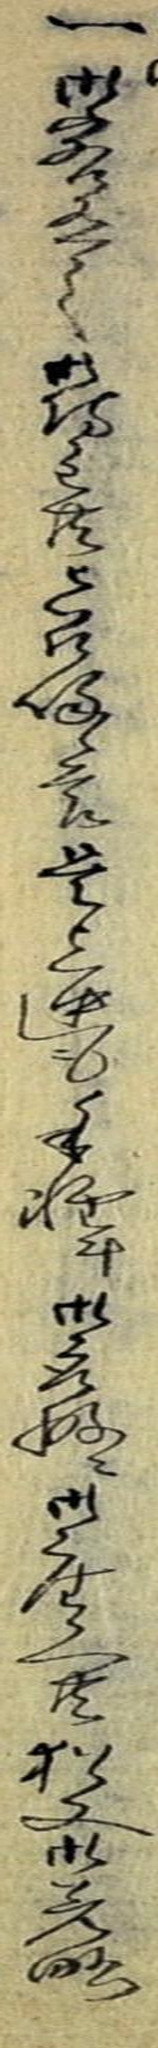○御客有之節御坊主共被召呼候節是迄迚も手軽斗御取扱に御座候へ共猶又御差略
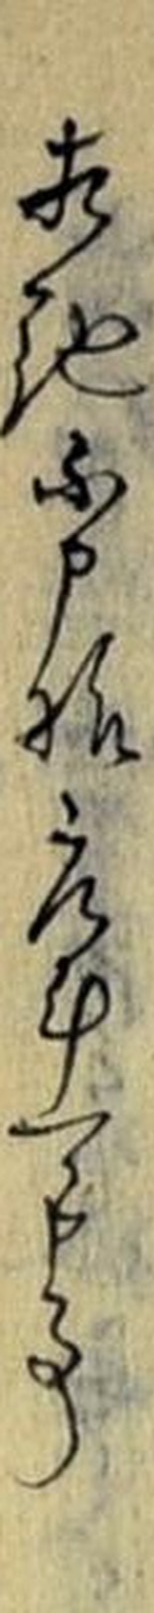相弛不申様取斗可申事
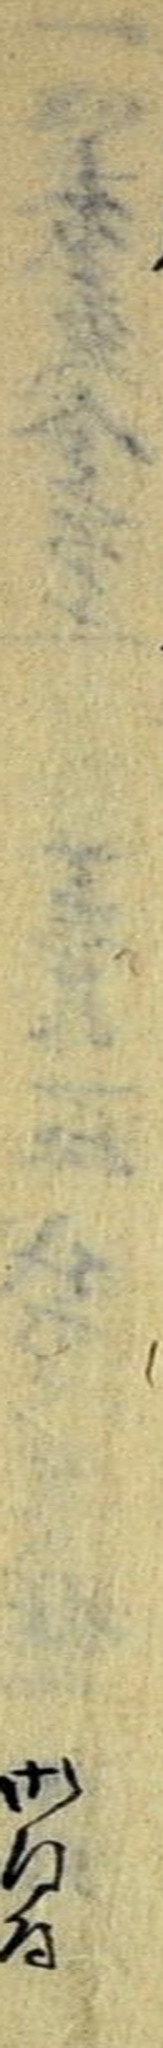御用人
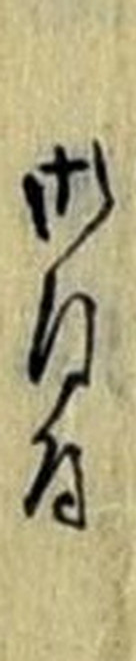御目付
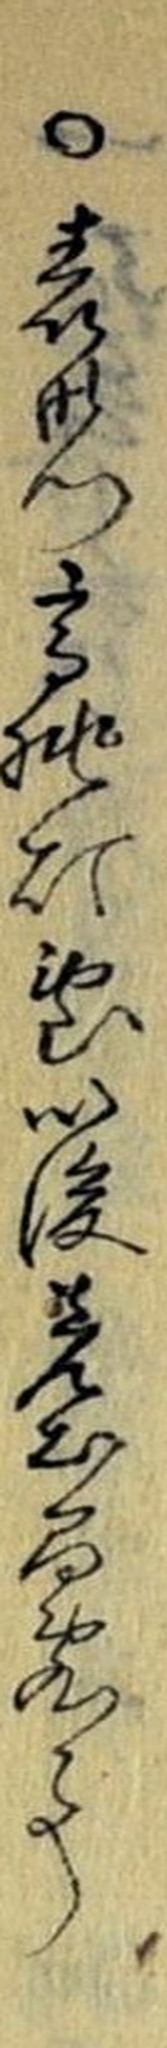○表御門高桃灯台以後差出間敷事
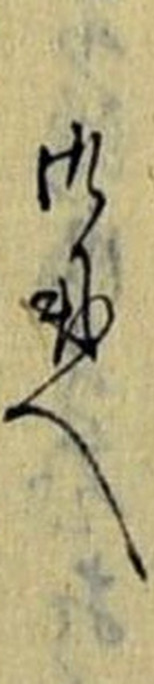御用人
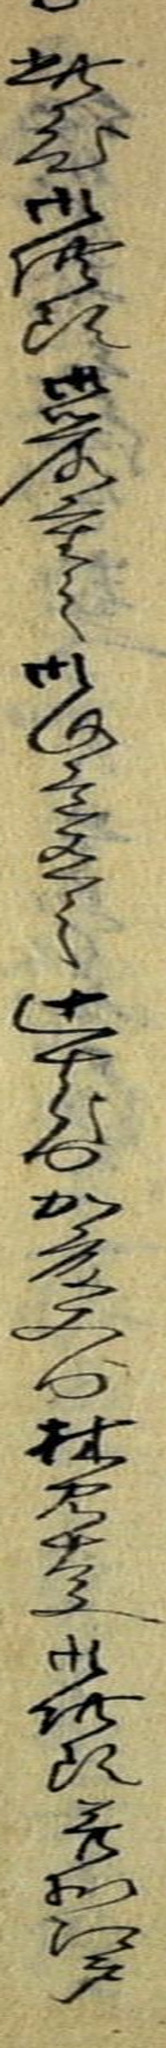○此度御供頭御厳重之御趣意有之辻十郎右衛門加藤又右衛門林忠太夫御供頭并於江戸
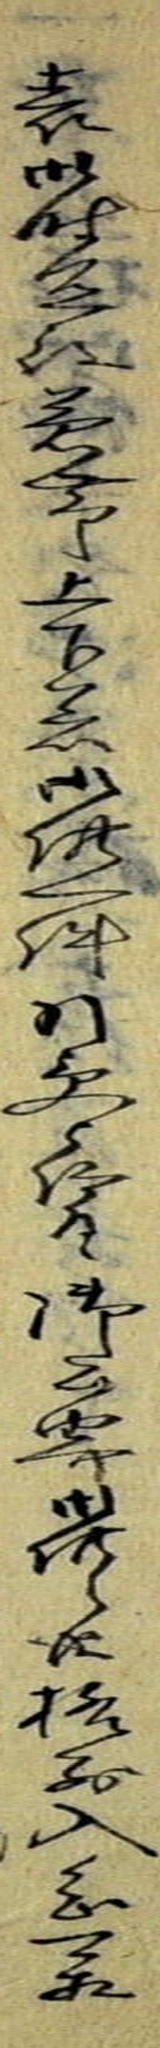表御時宜役兼帯上下着御供一件引受被仰付候御召寄御供之儀格別入念可相
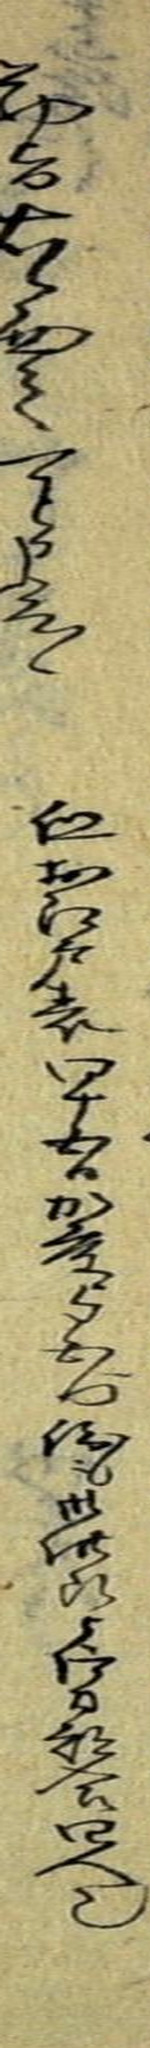勤旨右之面々へ可被申渡候但於江戸表同十五日加藤与五右衛門儀も御供頭被仰付都合四人也
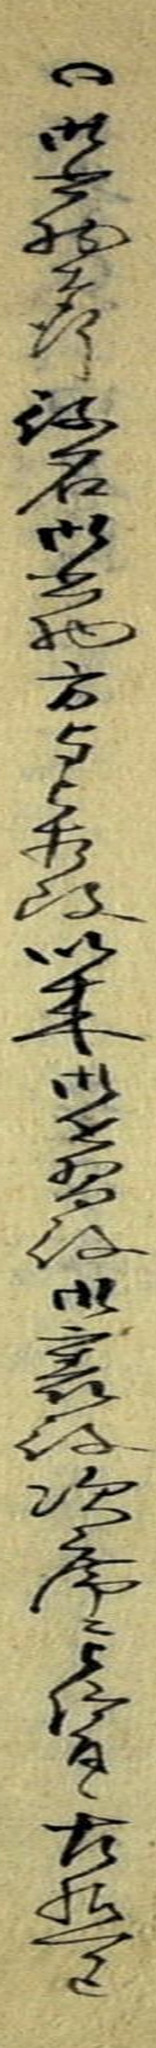○御書物奉行役名御書物方と被相改以来御近習役御裏役次席に被仰候左様可被
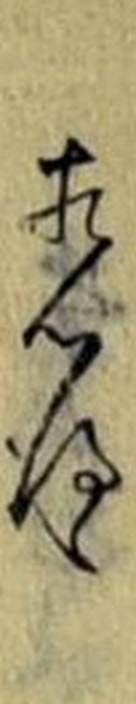相心得候
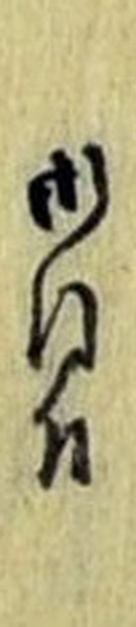御目付
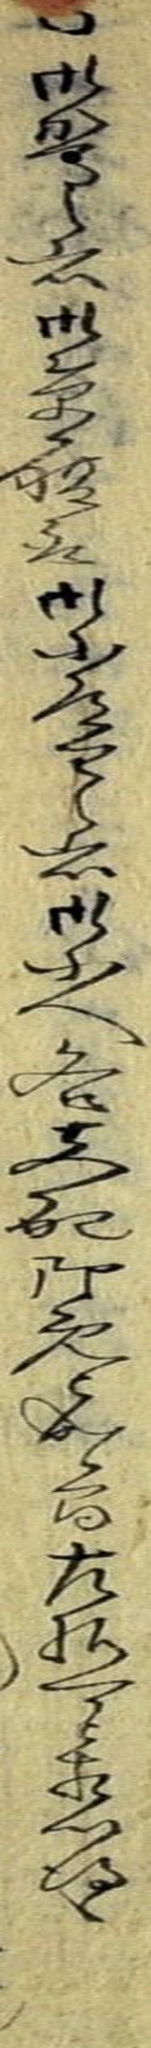○御駕之者御草履取御小道具之者御小人各支配御免被成候間左様可被相心得候
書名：命令之部 四
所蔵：福井県文書館 Fukui Prefectural Archives
